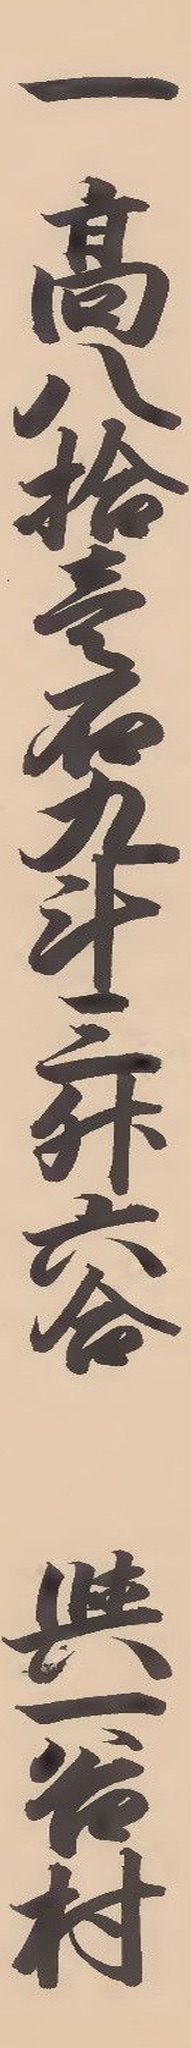一高八拾壱石九斗三升六合与一谷村
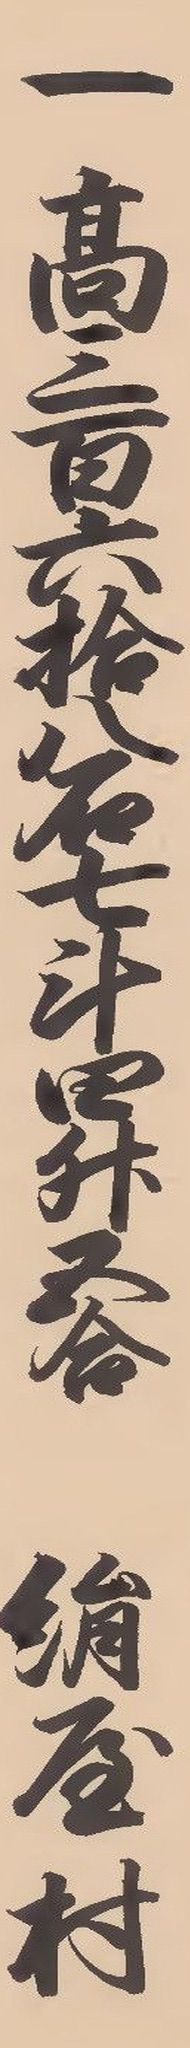一高三百六拾八石七斗四升五合絹屋村
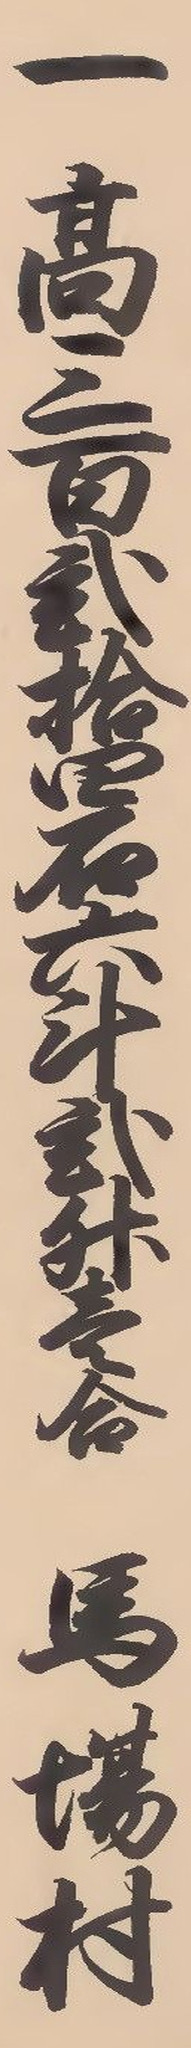一高三百弐拾四石六斗弐升壱合馬場村
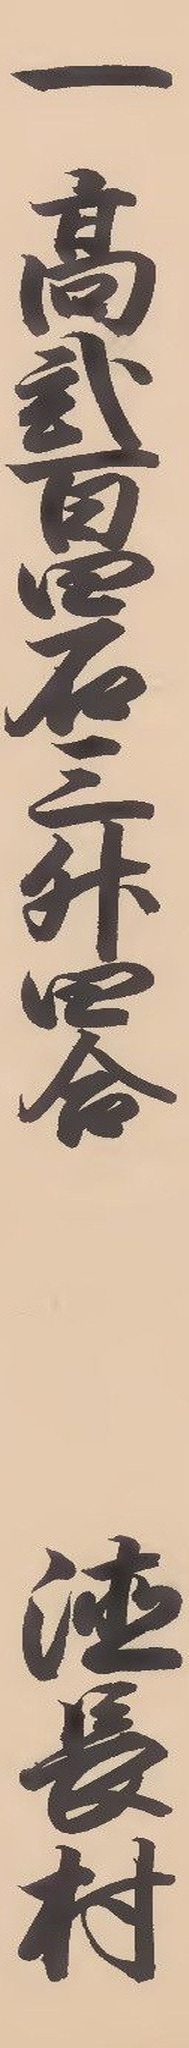一高弐百四石三升四合徳長村
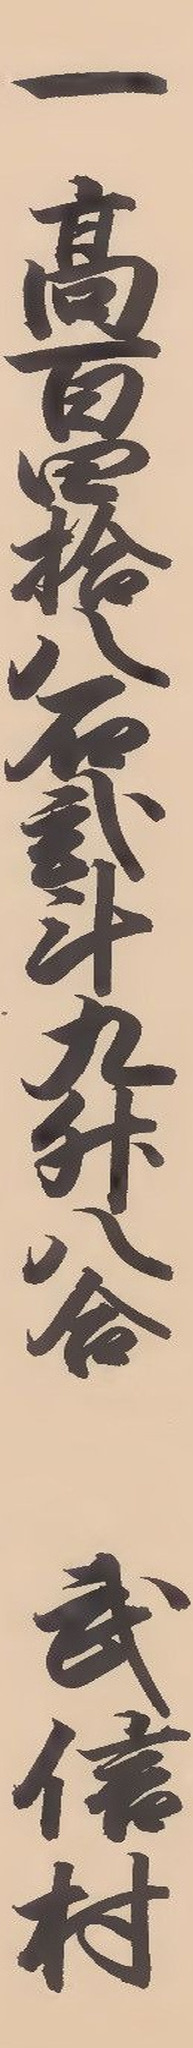一高百四拾八石弐斗九升八合武信村
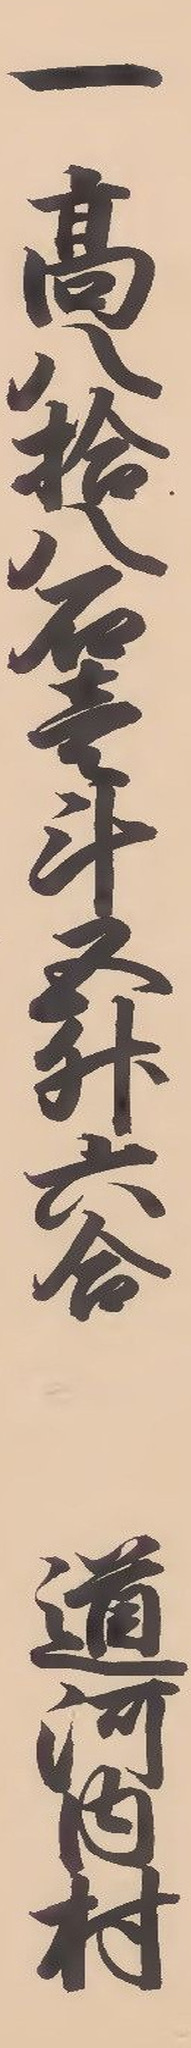一高八拾八石壱斗五升六合道河内村

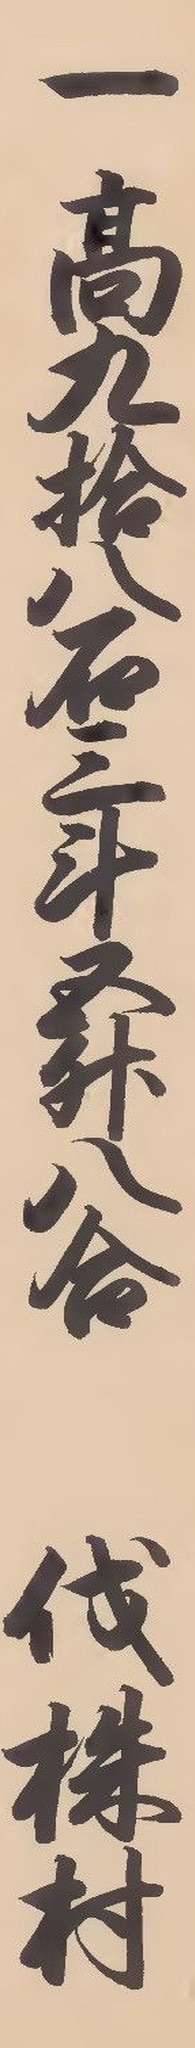一高九拾八石三斗五升八合伐株村
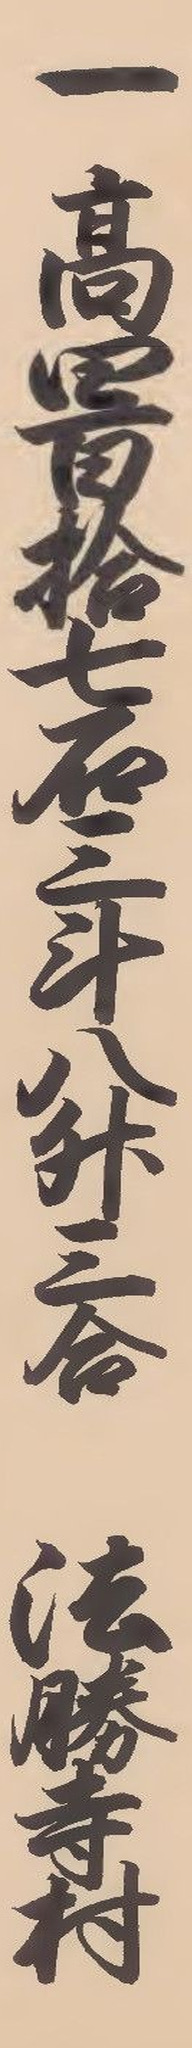一高四百拾七石三斗八升三合法勝寺村
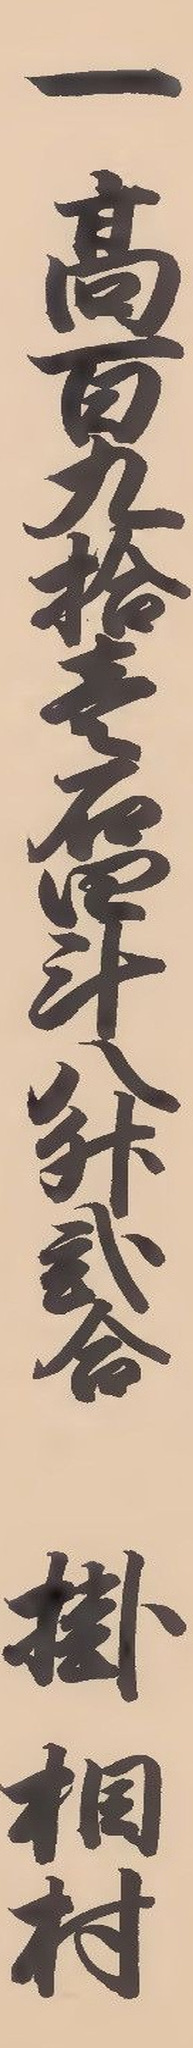一高百九拾壱石四斗八升弐合掛相村
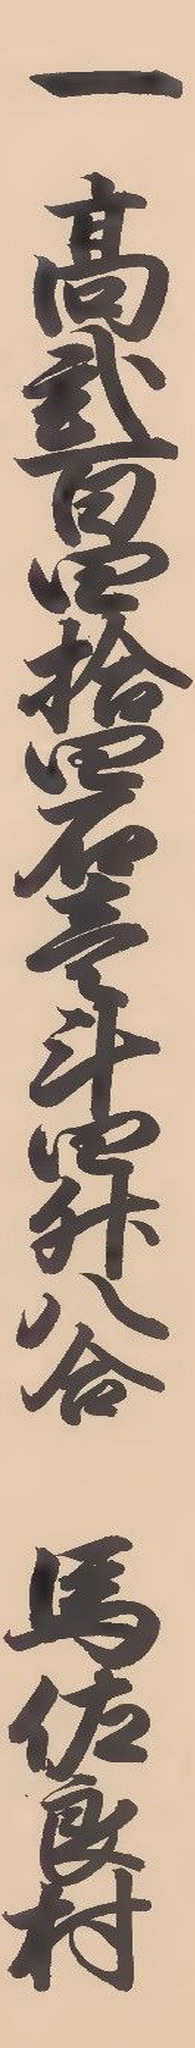一高弐百四拾四石壱斗四升八合馬佐良村
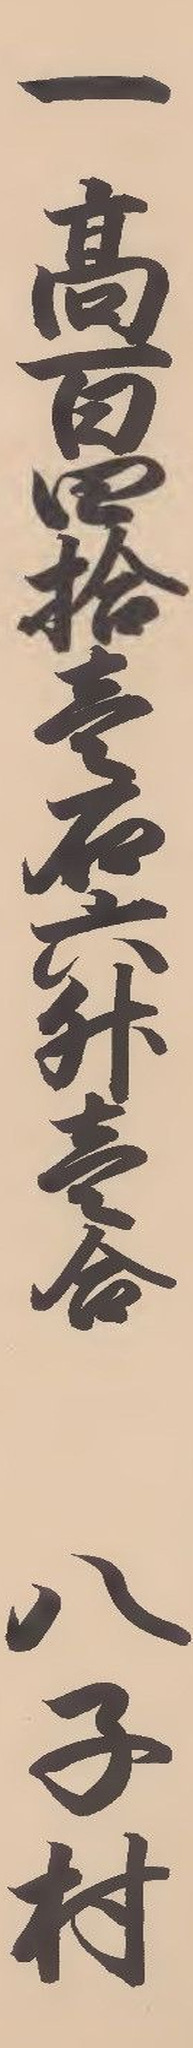一高百四拾壱石六升壱合八子村
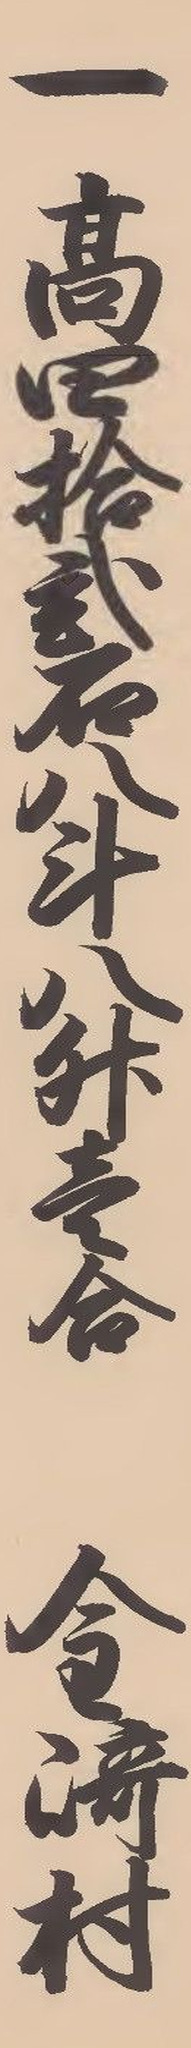一高四拾弐石八斗八升壱合金崎村
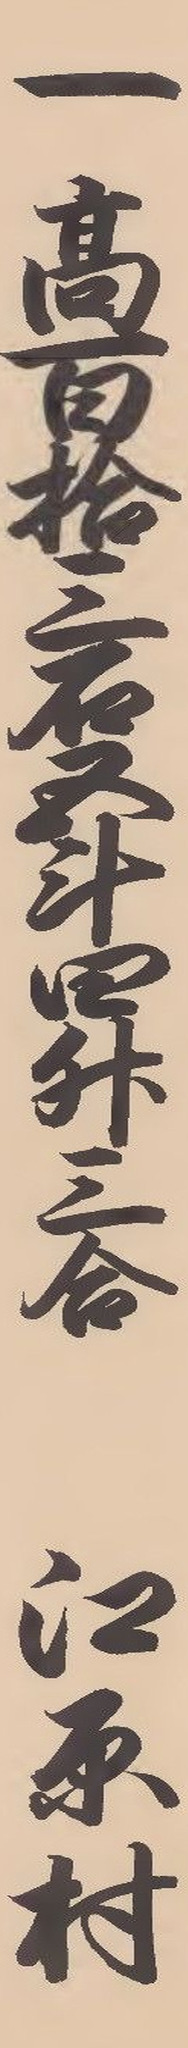一高百拾三石五斗四升三合江原村
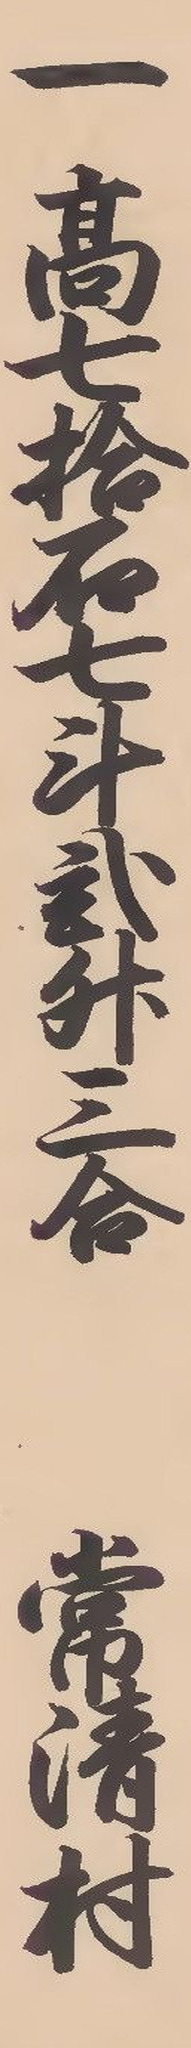一高七拾石七斗弐升三合常清村

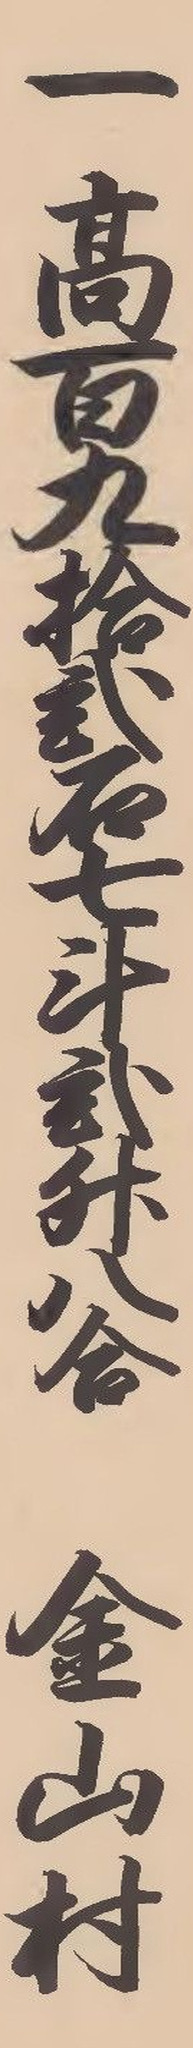一高百九拾弐石七斗弐升八合金山村
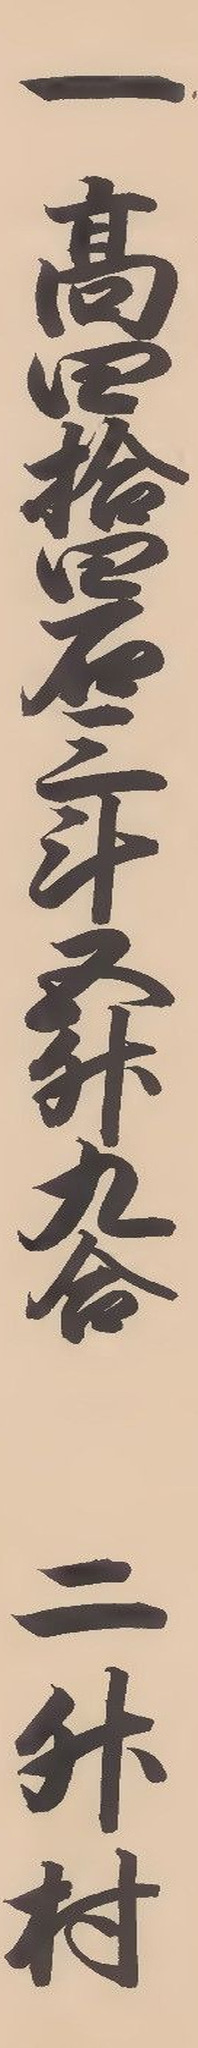一高四拾四石三斗五升九合二升村
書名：伯耆国郷帳
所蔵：国立公文書館 National Archives of Japan
